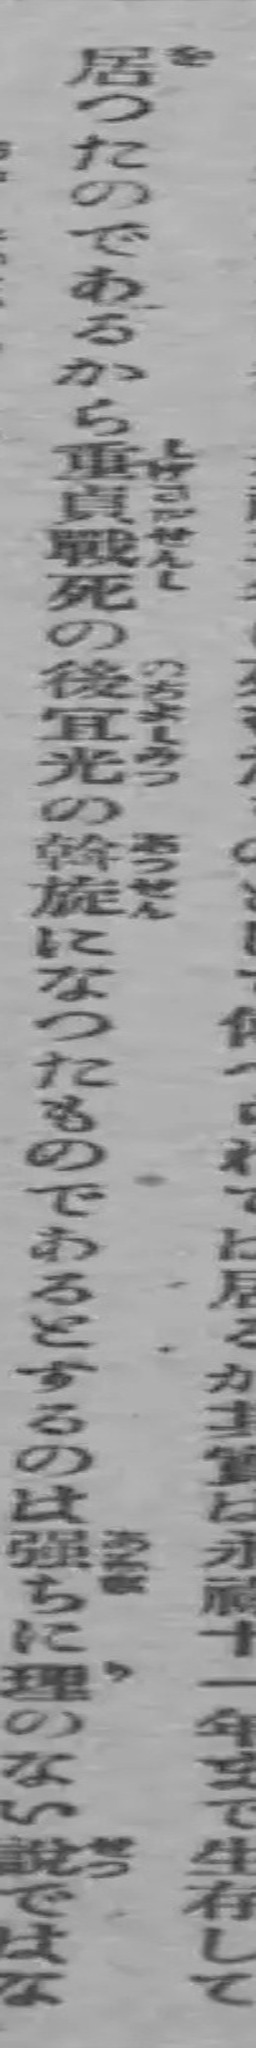居つたのであるから重貞戦死の後宜光の斡旋になつたものであるとするのは強ちに理のない説ではな
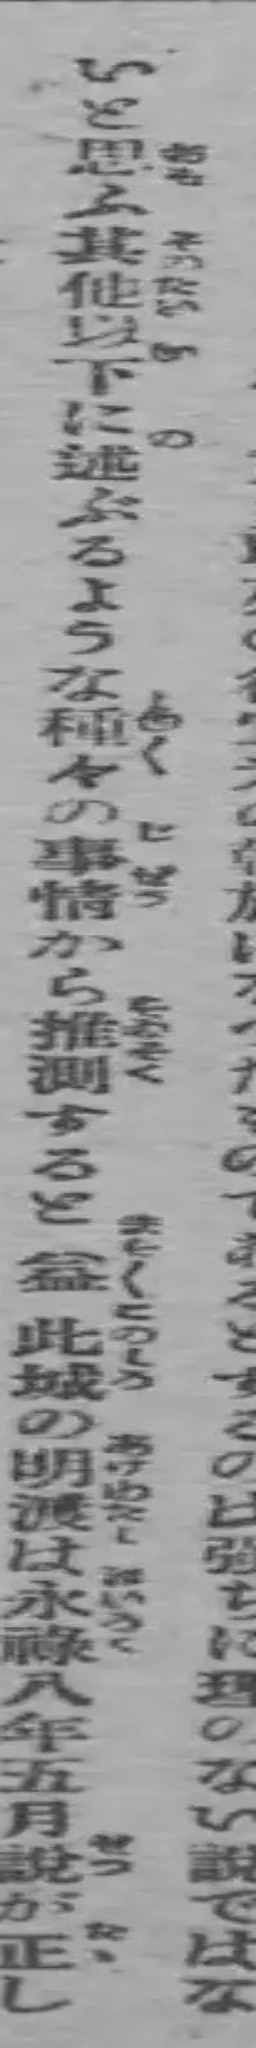いと思ふ其他以下に述ぶるような種々の事情から推測すると益此城の明渡は永禄八年五月説が正し
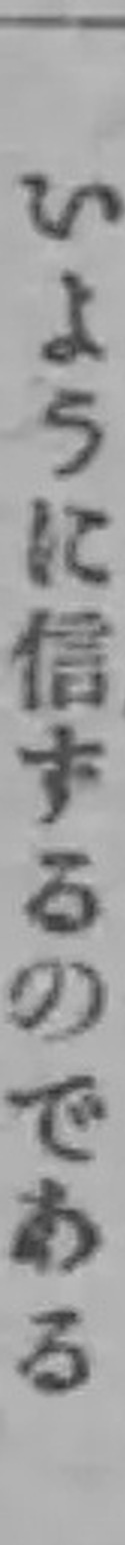いように信ずるのである
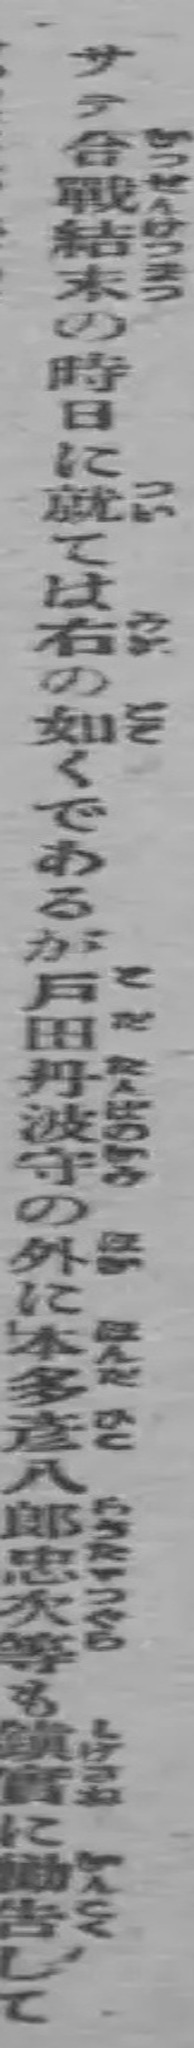合戦の結果サテ合戦結末の時日に就ては右の如くであるが戸田丹波守の外に本多彦八郎忠次等も鎮実に勧告して
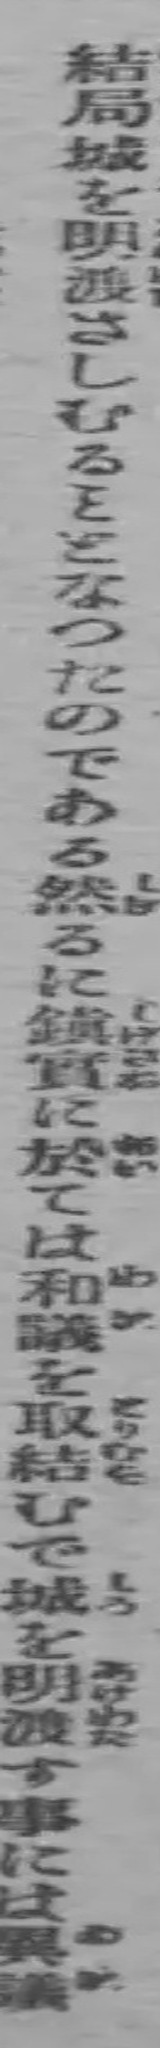結局城を明渡さしむることとなつたのである然るに鎮実に於ては和議を取結むで城を明渡す事には異議
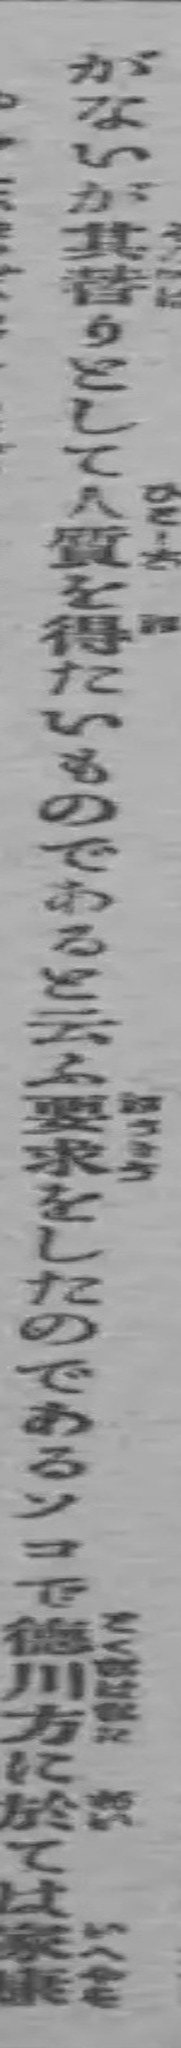がないが其替りとして人質を得たいものであると云ふ要求をしたのであるソコで徳川方に於ては家康
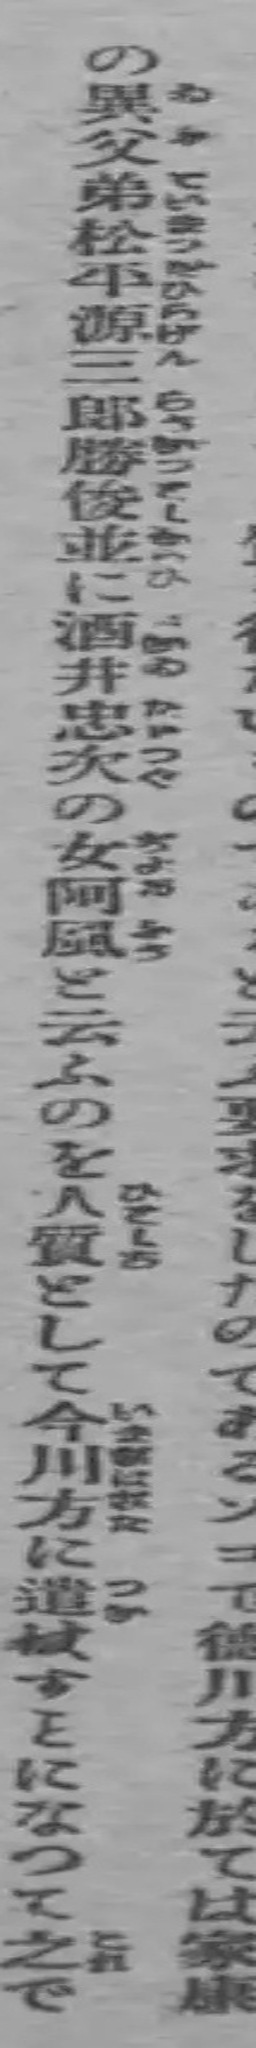の異父弟松平源三郎勝俊並に酒井忠次の女阿風と云ふのを人質として今川方に遣はすことなつて之で
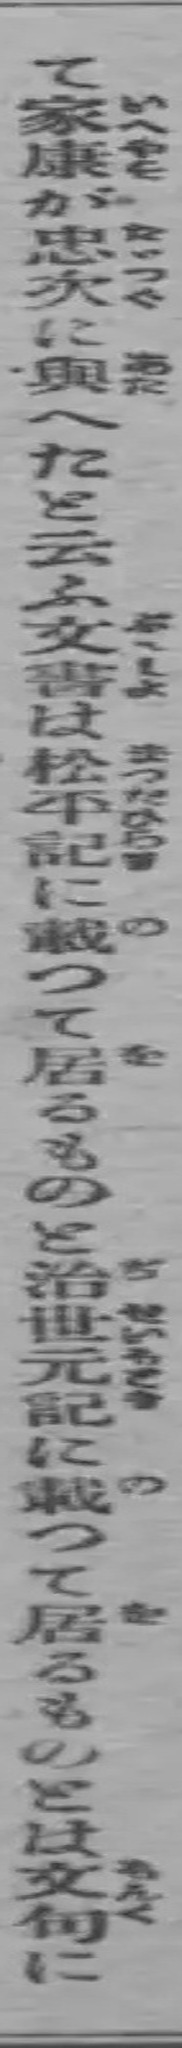に賜ふて家康が忠次に与へたと云ふ文書は松平記に載つて居るものと治世元記に載つて居るものとは文句に
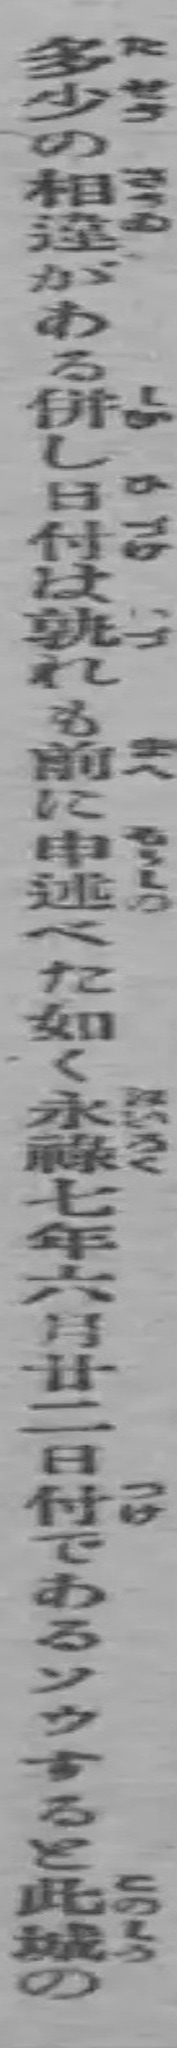多少の相違がある併し日付は孰れも前に申述べた如く永禄七年六月廿二日付であるソウすると此城の
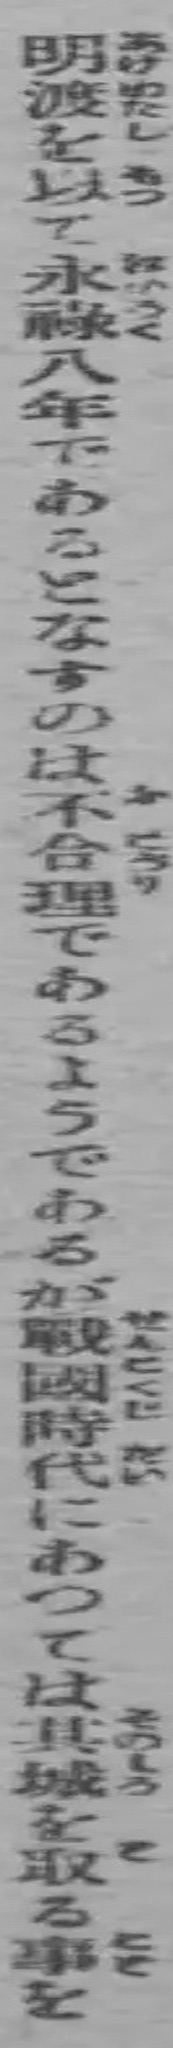明渡を以て永禄八年であるとなすのは不合理であるようであるが戦国時代にあつては其城を取る事を
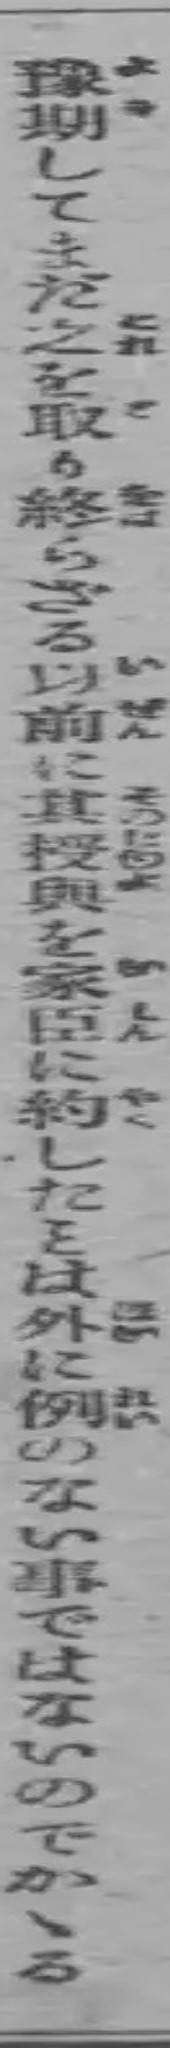予期してまだ之を取り終らざる以前に其授与を家臣に約したことは外に例のない事ではないのでかゝる
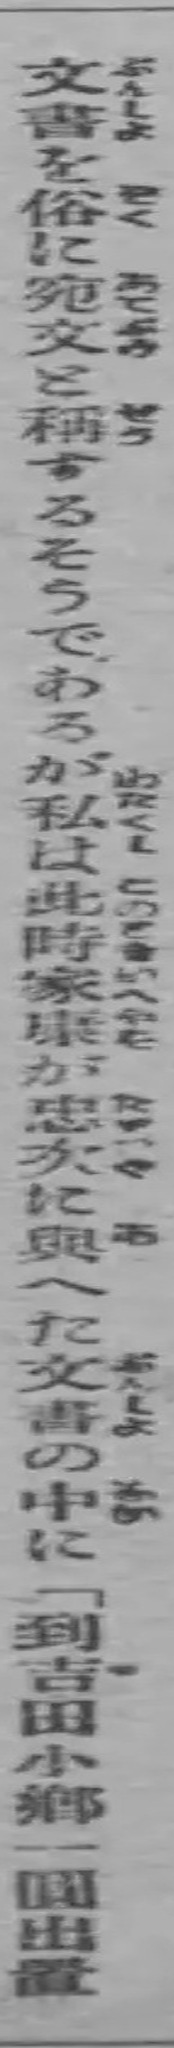文書を俗宛文と称するそうであるが私は此時家康が忠次に与へた文書の中に「到吉田小郷一円出置
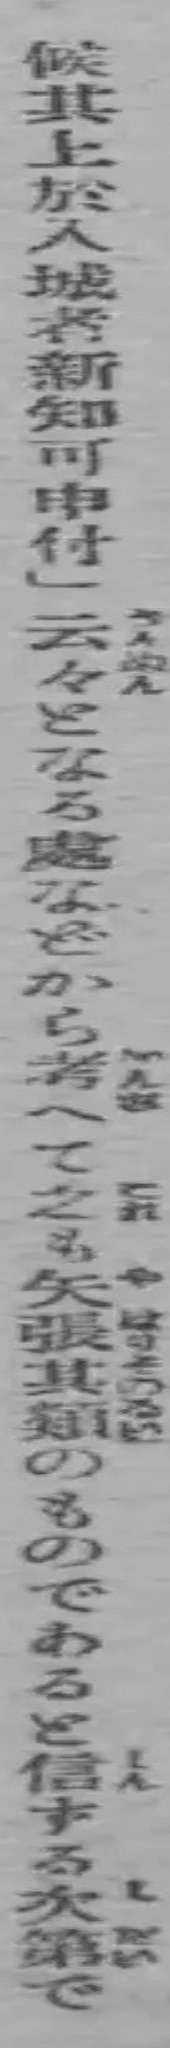候其上於入城者新知可申付」云々となる処などから考へて之も矢張其類のものであると信ずる次第で
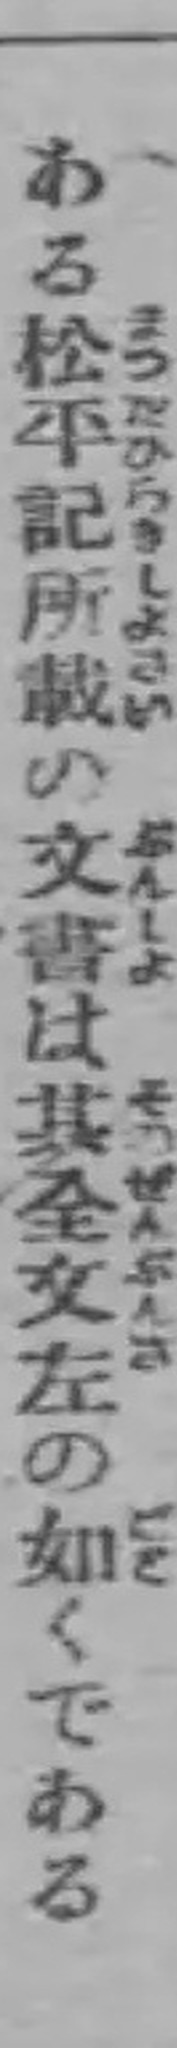ある松平記所載の文書は其全文左の如くである
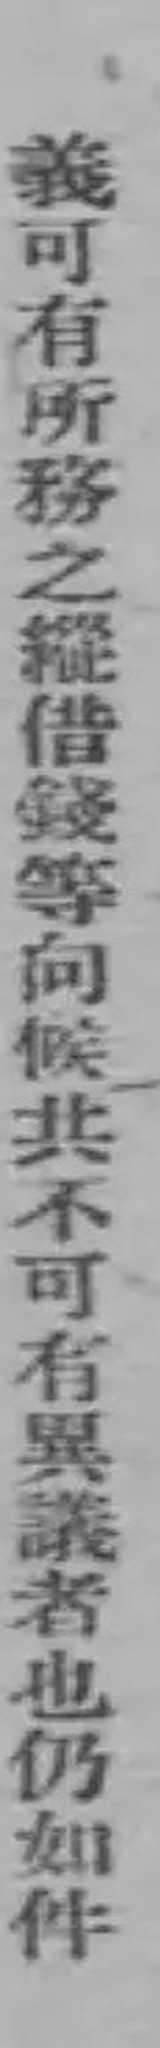義可有所務之縦借銭等向候共不可有異議者也仍如件
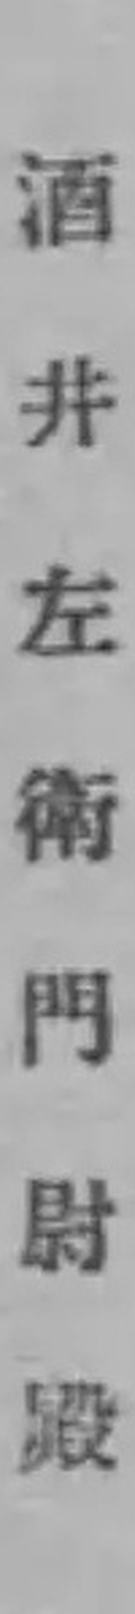酒井左衛門尉殿
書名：豊橋市史談
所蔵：国立国会図書館 National Diet Library, JAPAN
